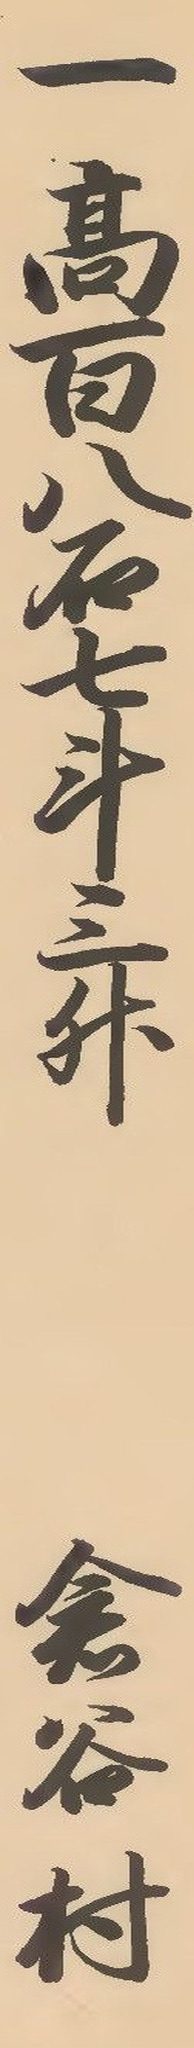一高百八石七斗三升倉谷村
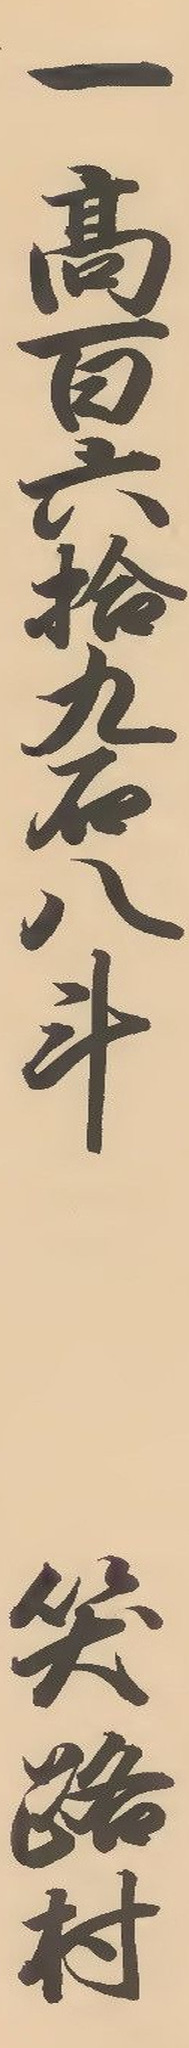一高百六拾九石八斗笑路村
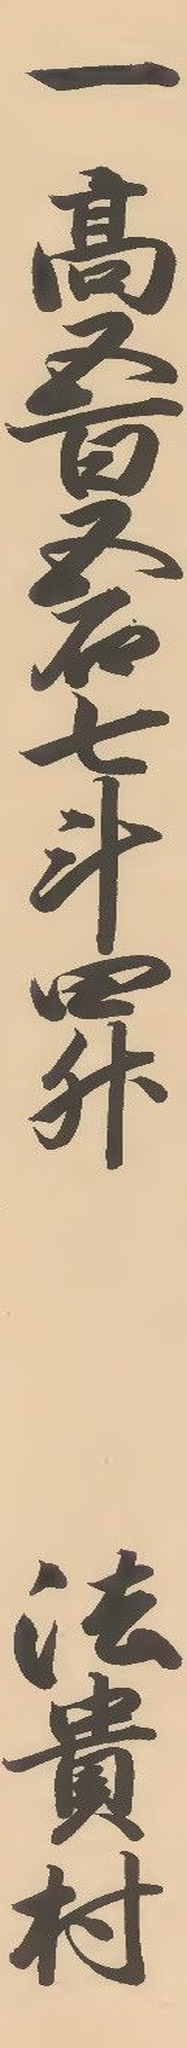一高五百五石七斗四升法貴村
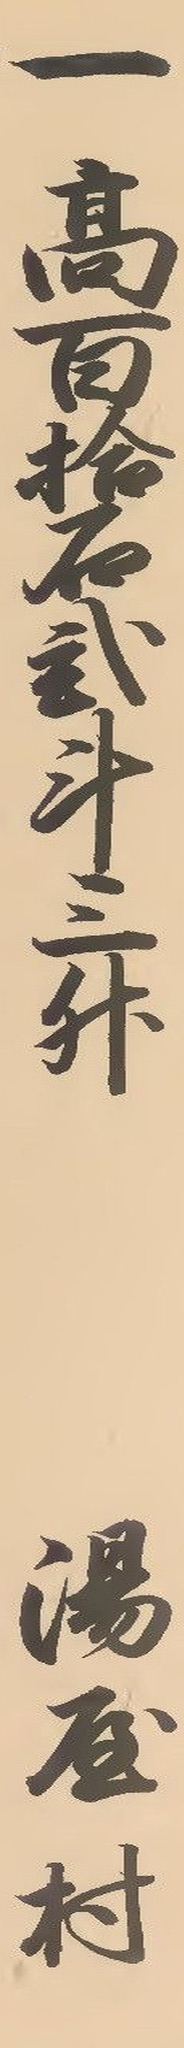一高百拾石弐斗三升湯屋村
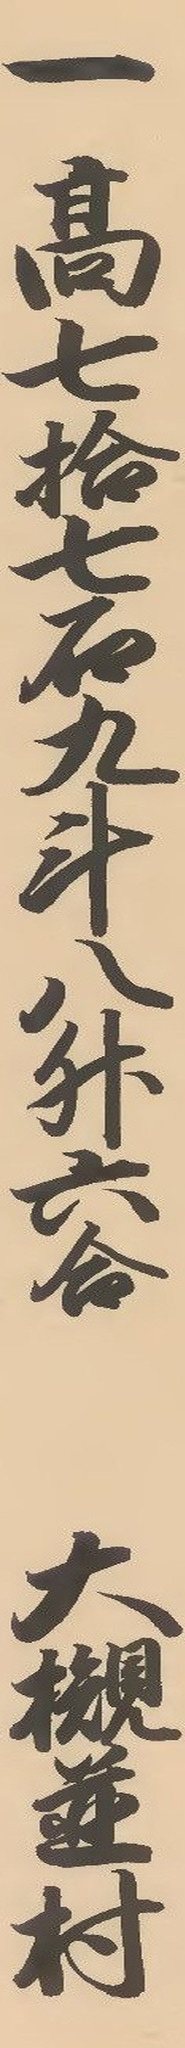一高七拾七石九斗八升六合大槻並村
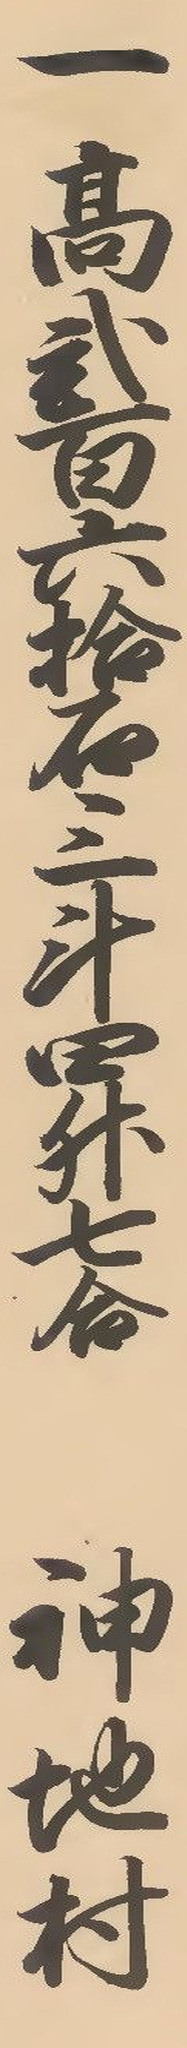一高弐百六拾石三斗四升七合神地村

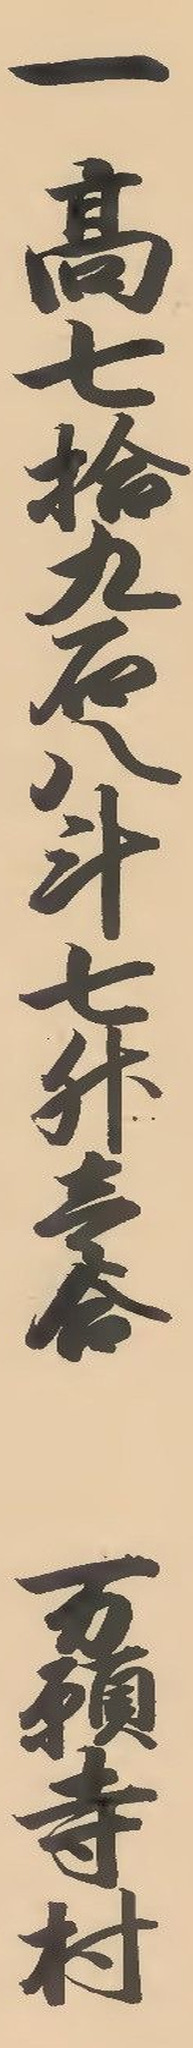一高七拾九石八斗七升壱合万願寺村
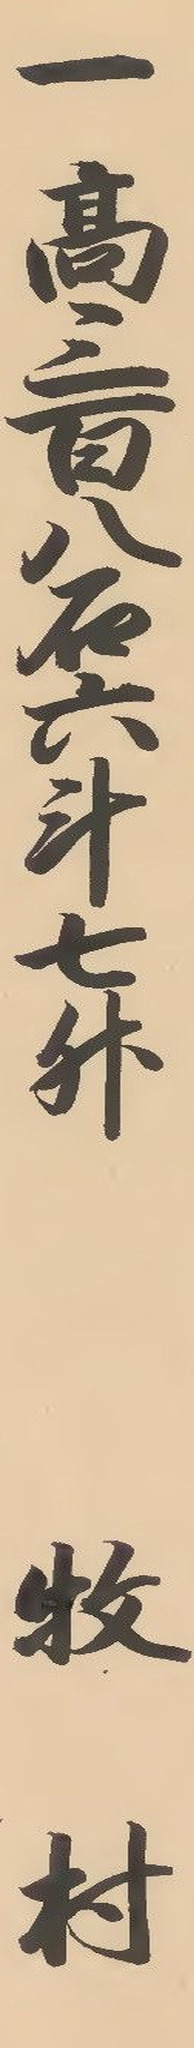一高三百八石六斗七升牧村
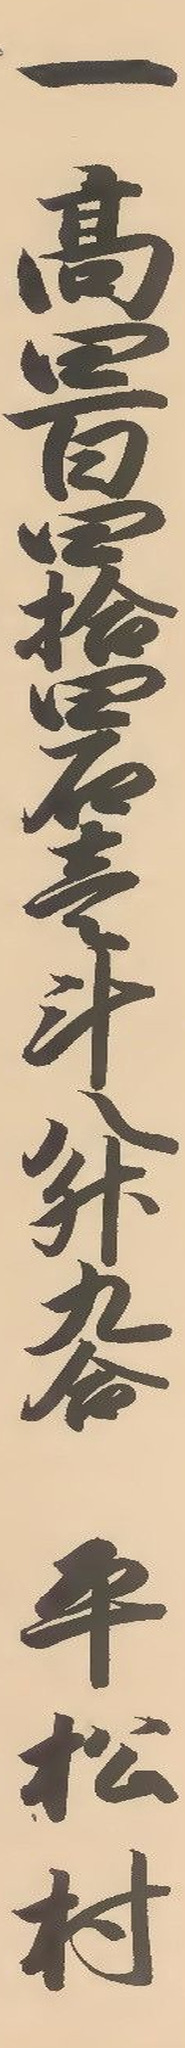一高四百四拾四石壱斗八升九合平松村
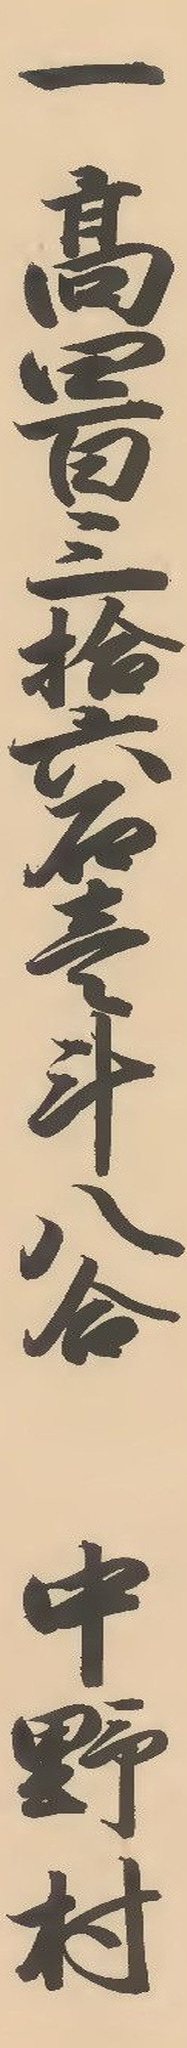一高四百三拾六石壱斗八合中野村
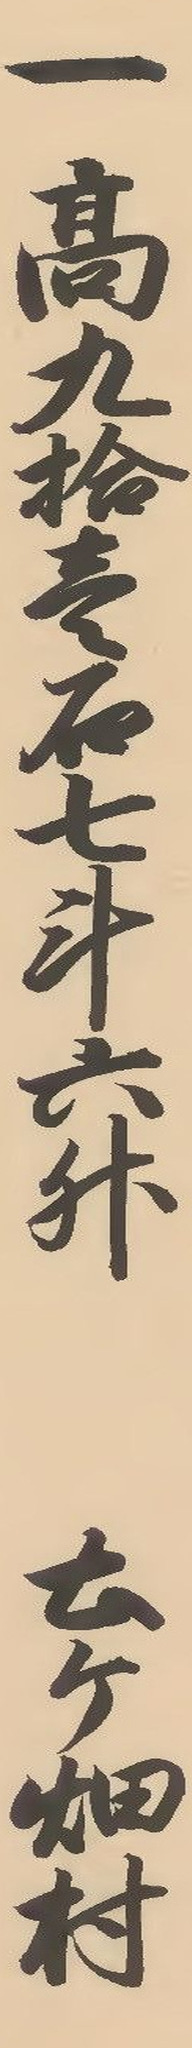一高九拾壱石七斗六升土ヶ畑村
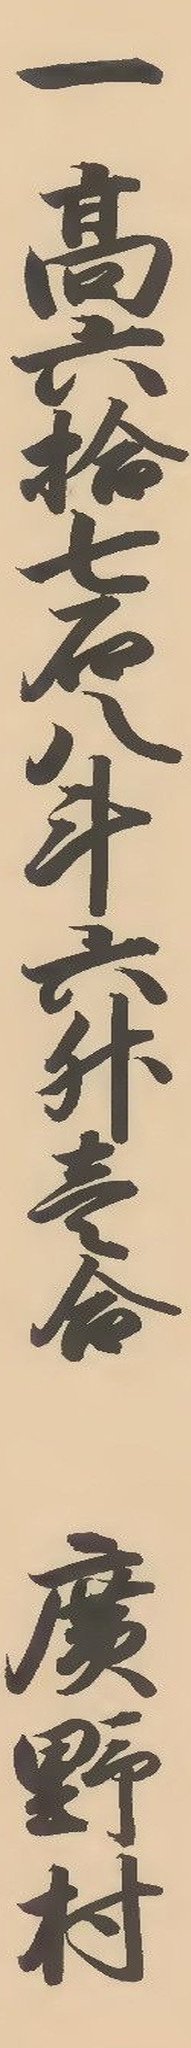一高六拾七石八斗六升壱合広野村

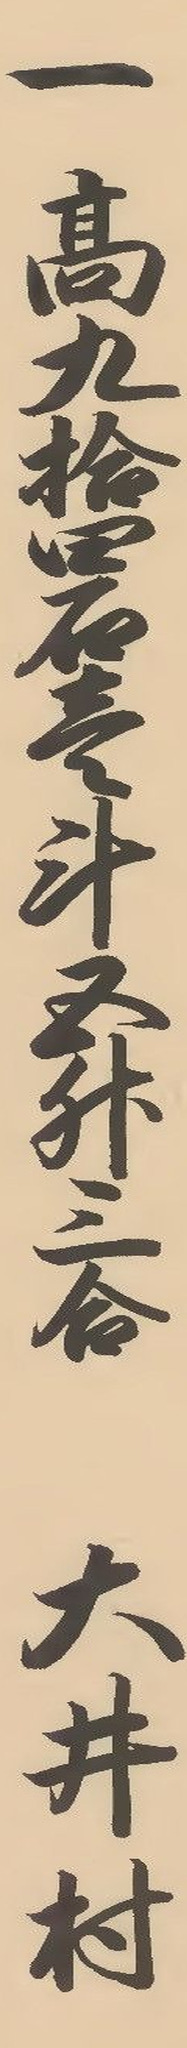一高九拾四石壱斗五升三合大井村
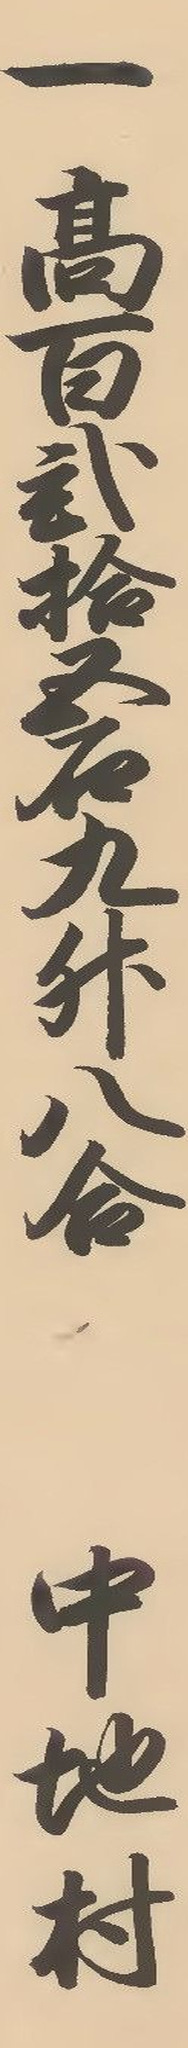一高百弐拾五石九升八合中地村
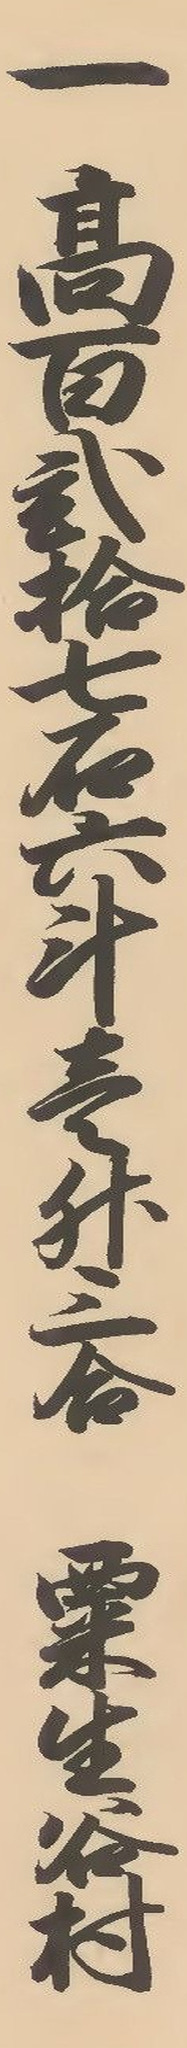一高百弐拾七石六斗壱升三合粟生谷村
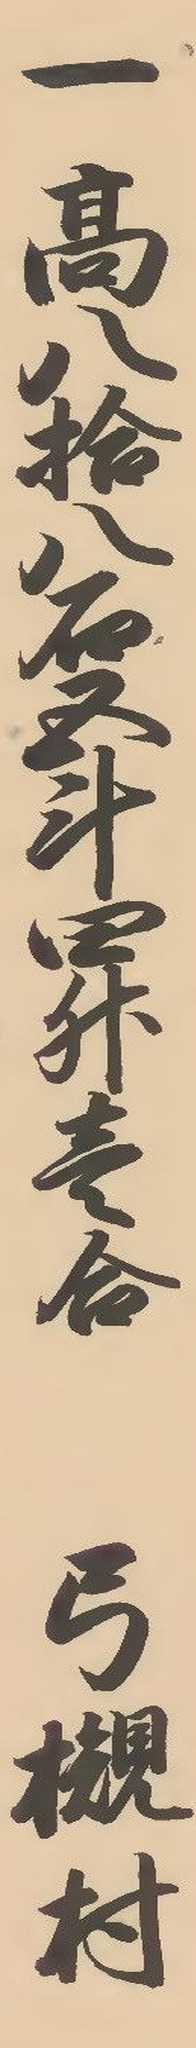一高八拾八石五斗四升壱合弓槻村
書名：丹波国郷帳
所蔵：国立公文書館 National Archives of Japan
